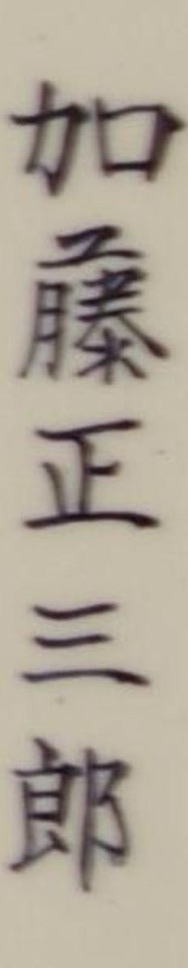加藤正三郎
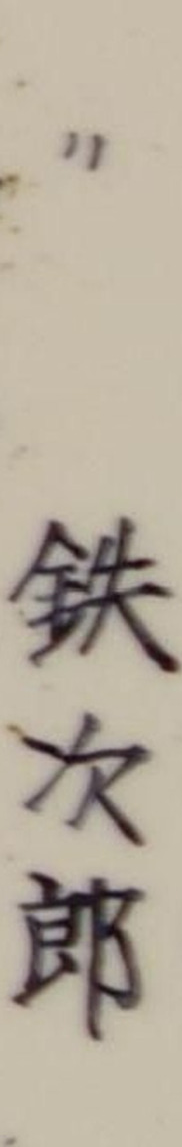鉄次郎
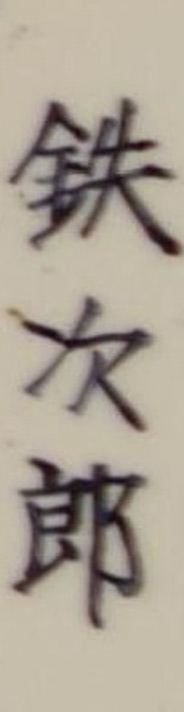鉄次郎
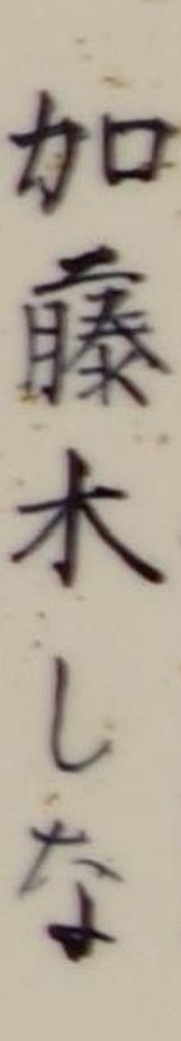加藤木しな
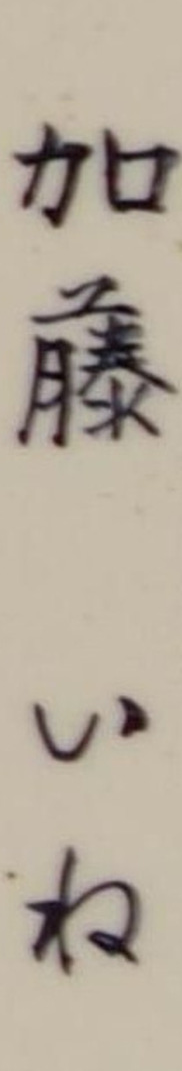加藤いね
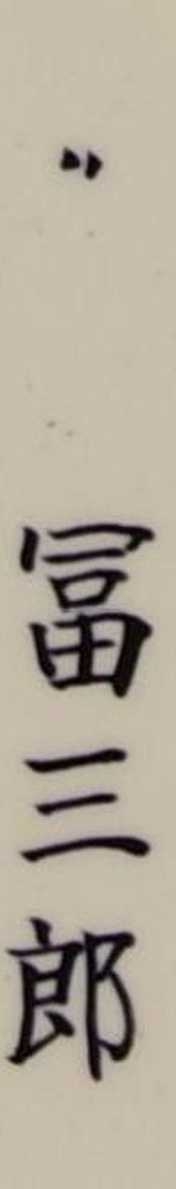冨三郎
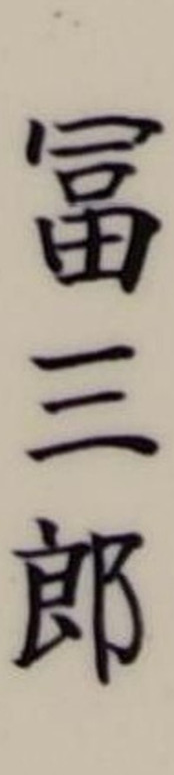冨三郎

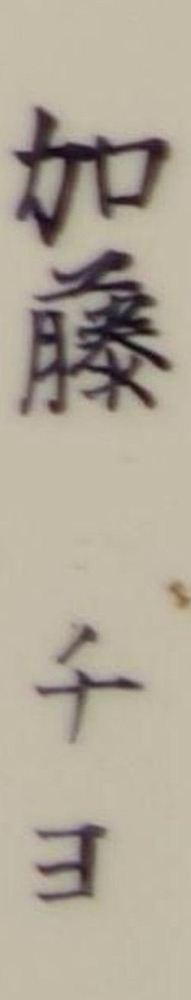加藤チヨ
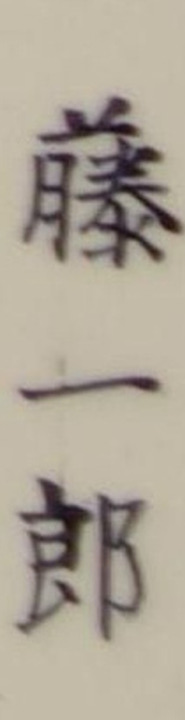藤一郎
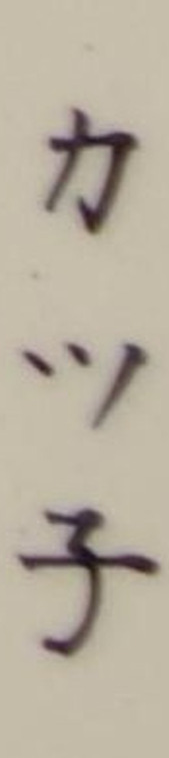カツ子
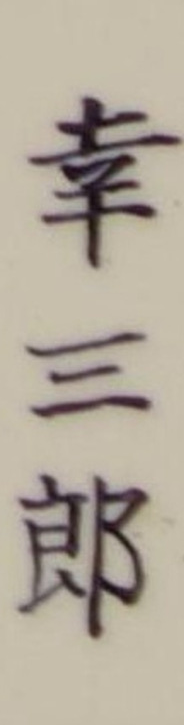幸三郎
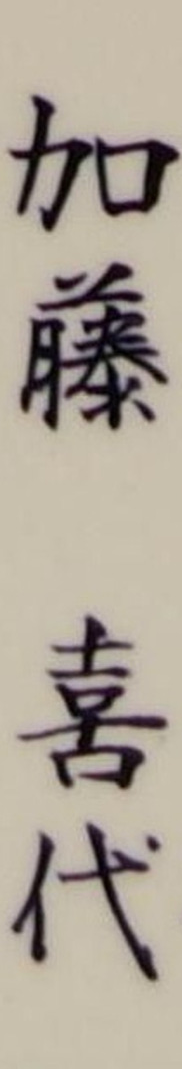加藤喜代
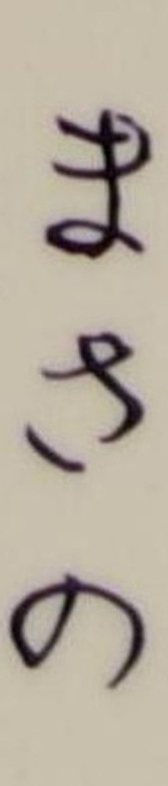まさの
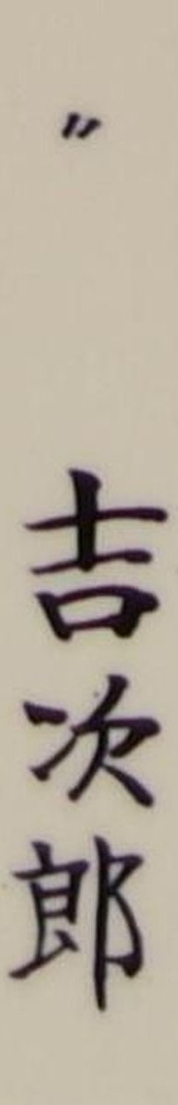吉次郎
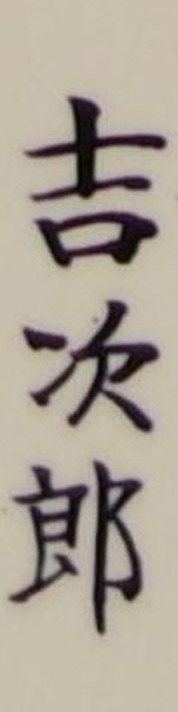吉次郎
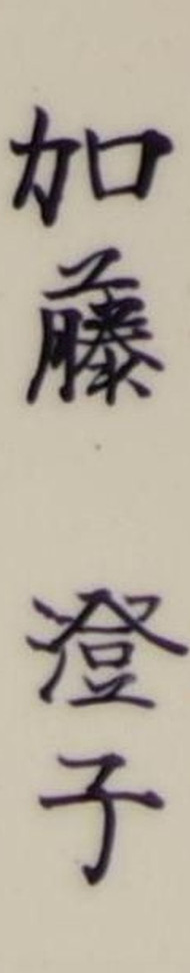加藤澄子
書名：M~S
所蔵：高野山金剛峯寺
